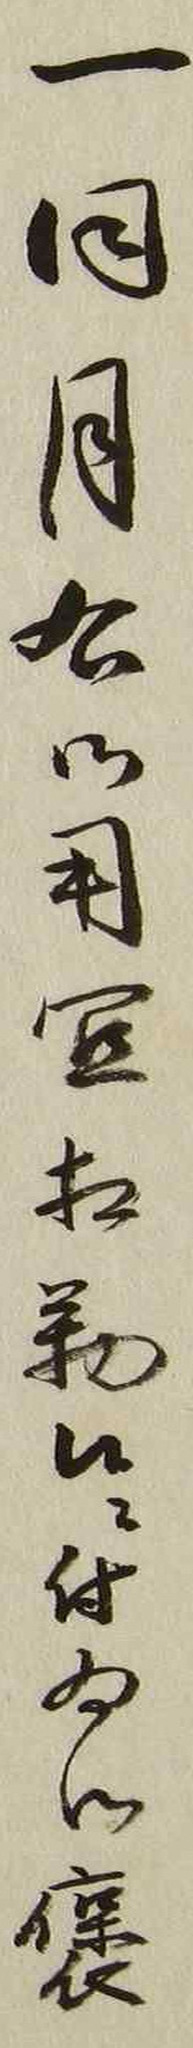一同月右御用宜相勤候ニ付為御褒
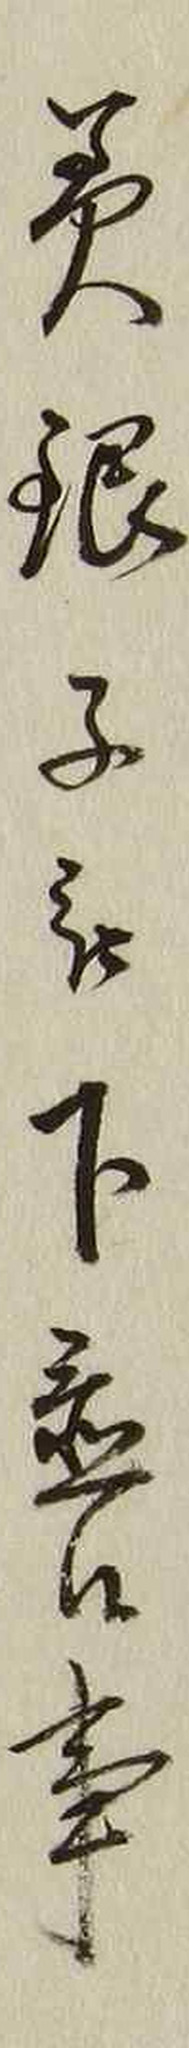美銀子被下置候事
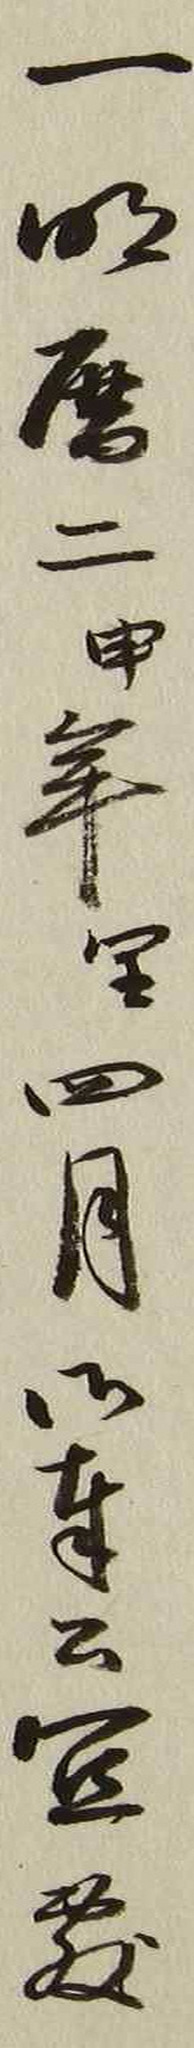一明暦二申年閏四月御奉公宜敷
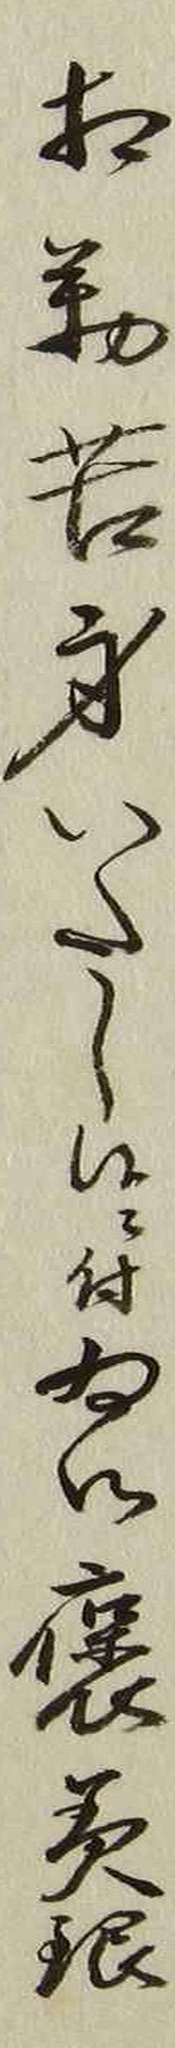相勤苦身いたし候ニ付為御褒美銀
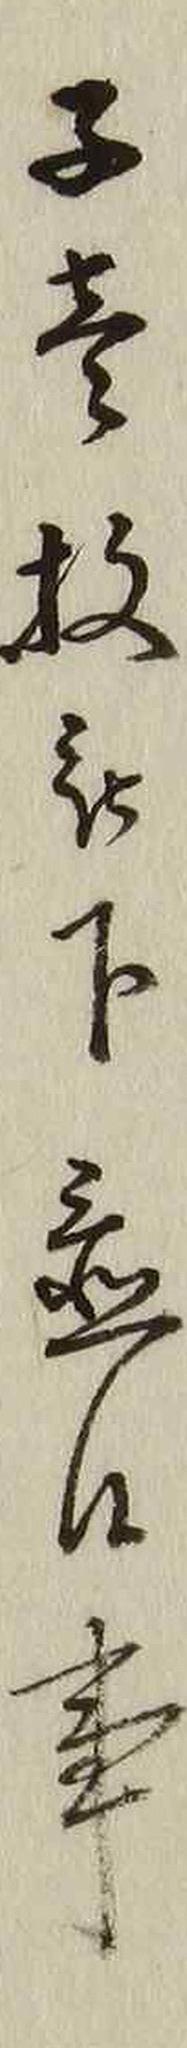子壱枚被下置候事
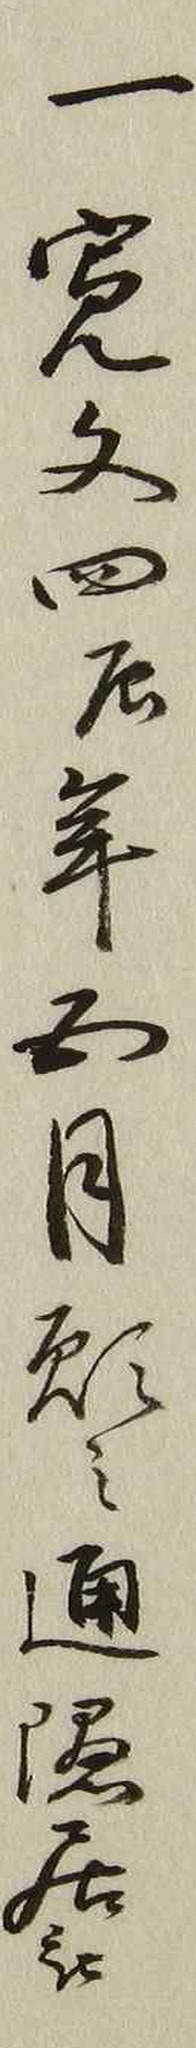一寛文四辰年五月願之通隠居被
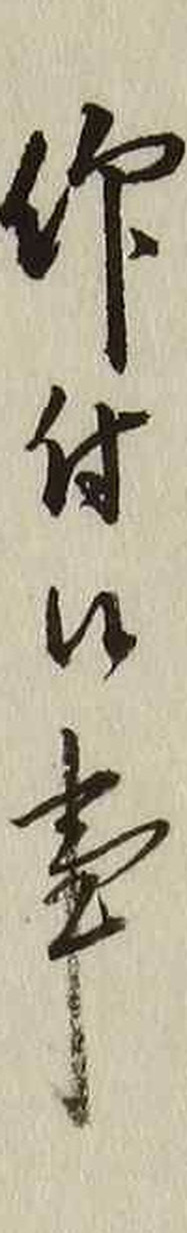仰付候事
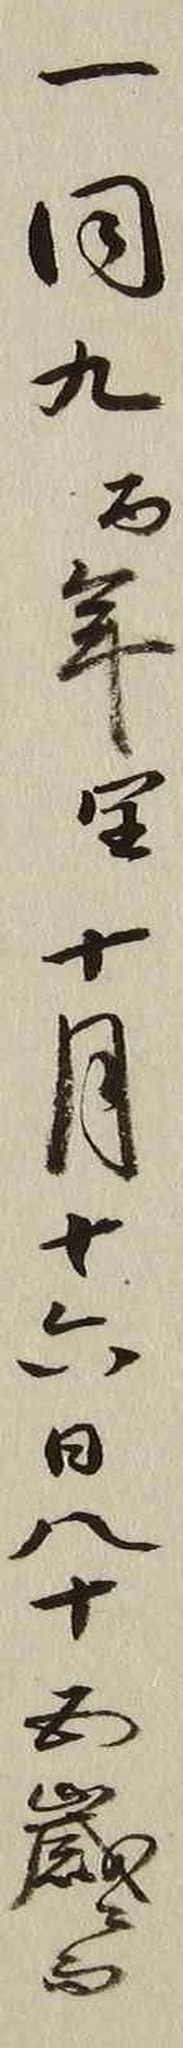一同九酉年閏十月十六日八十五歳ニ而
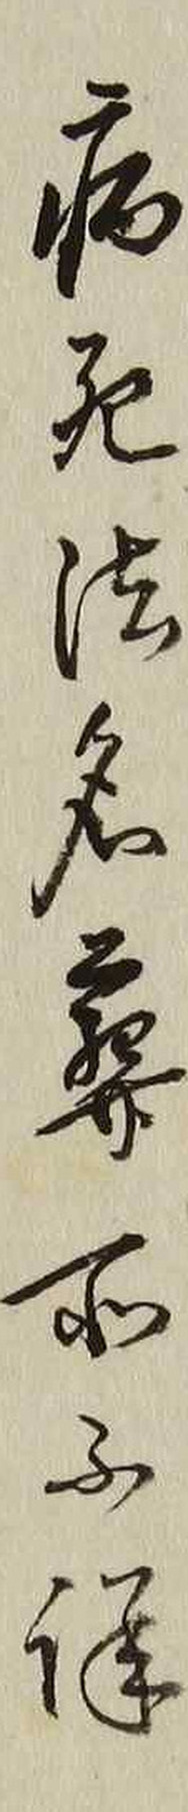病死法名葬所不詳
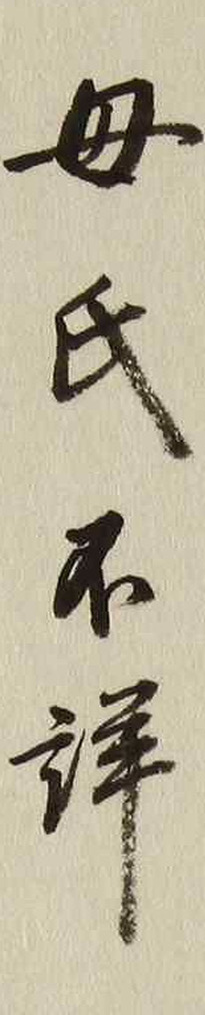母氏不詳
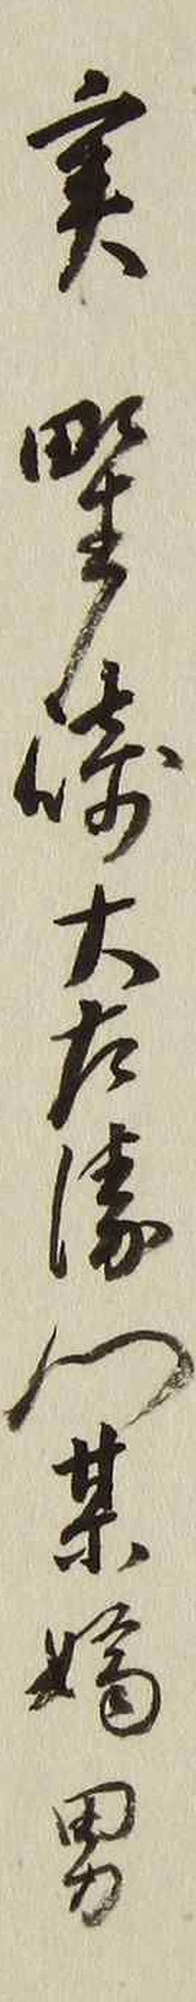実野崎大左衛門某嫡男
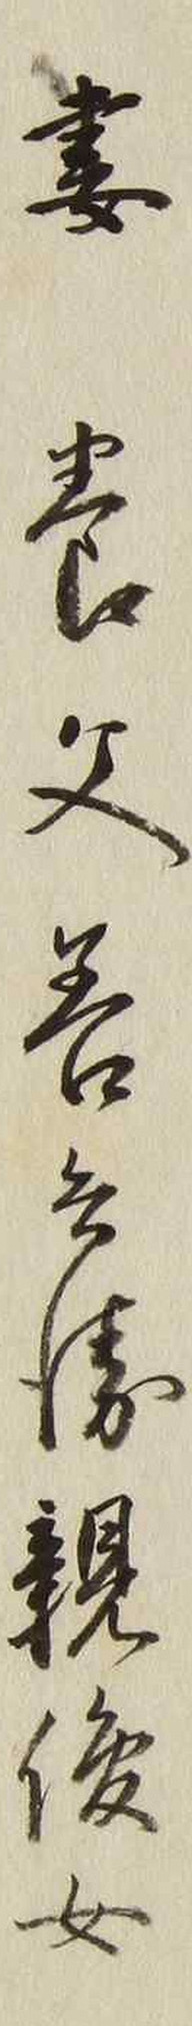妻養父善兵衛親俊女

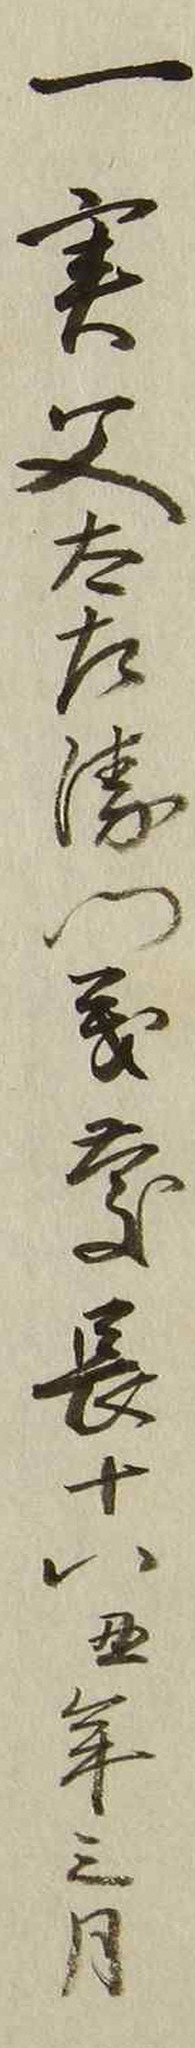一実父太左衛門義慶長十八丑年三月
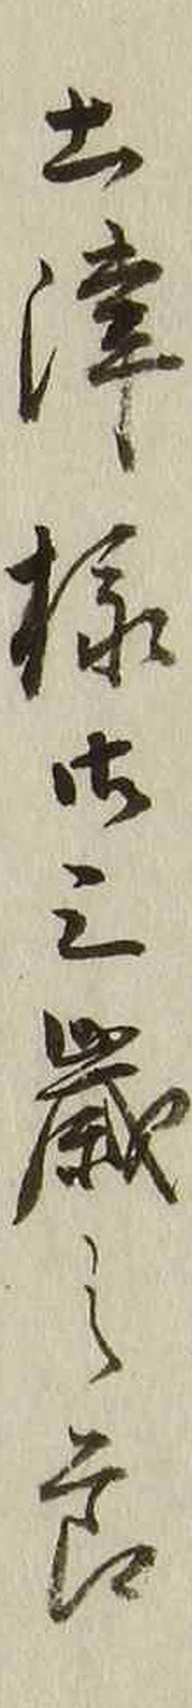土津様御三歳之節
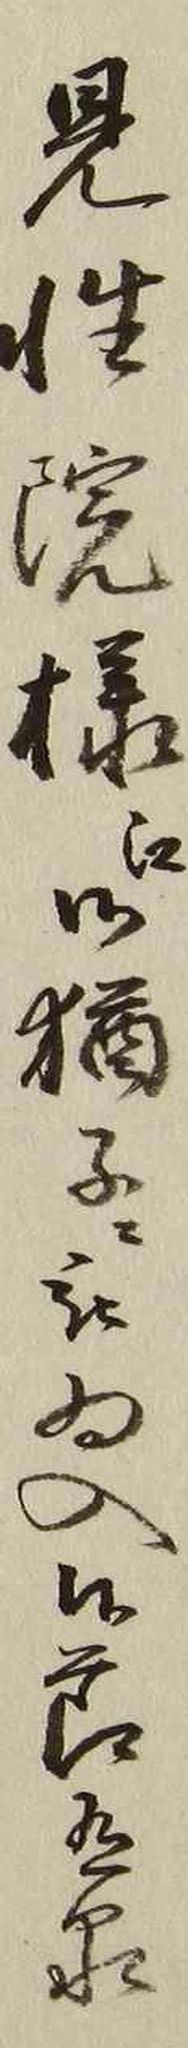見性院様江御猶子ニ被為入候節有泉
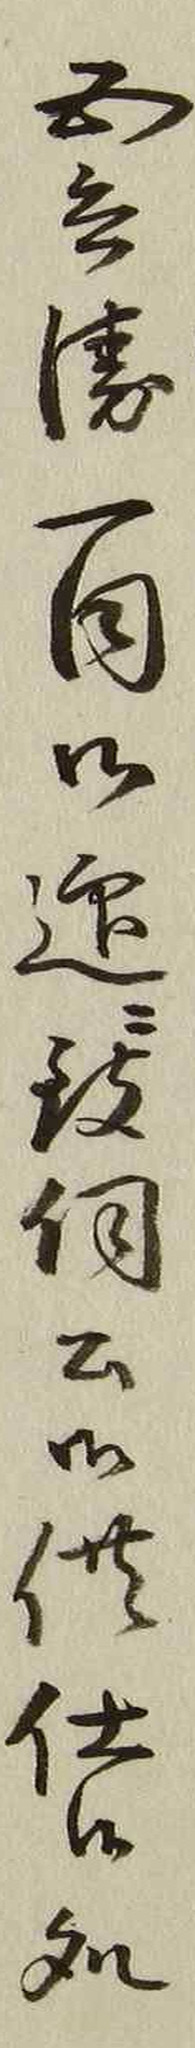五兵衛一同御迎ニ候致伺公御供仕処
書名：諸士系譜　巻之149　そ之部2
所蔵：会津若松市立会津図書館
